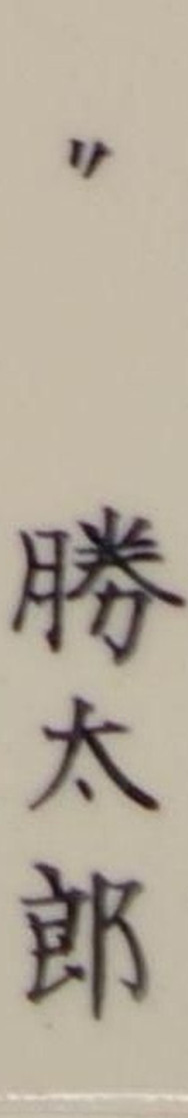勝太郎
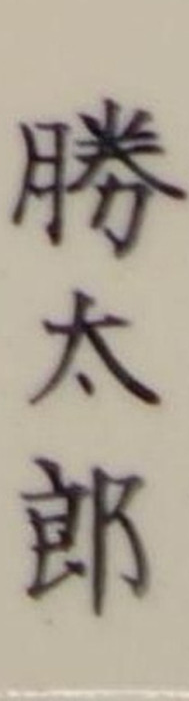勝太郎
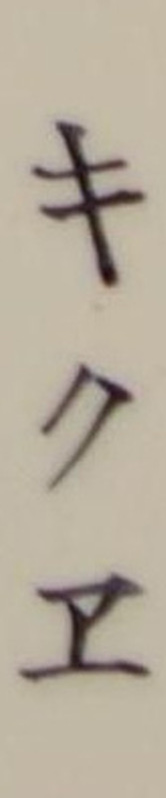キクエ
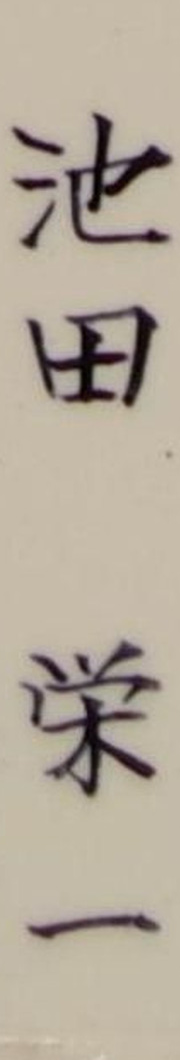池田栄一
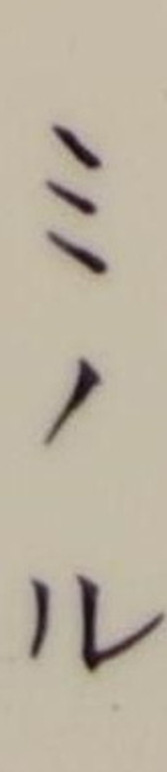ミノル
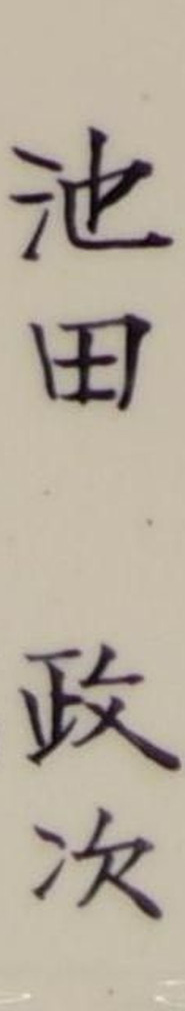池田政次
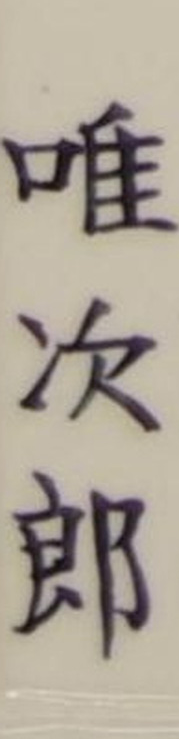唯次郎

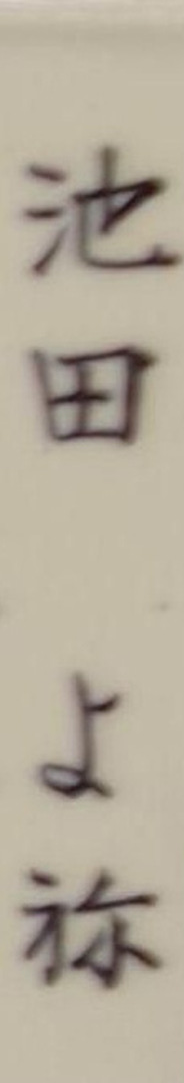池田よね
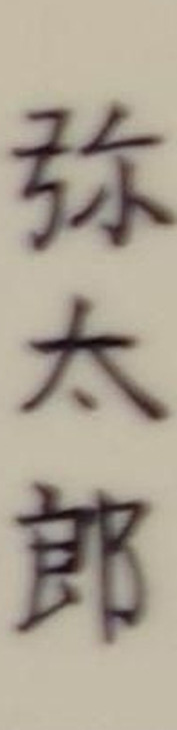弥太郎
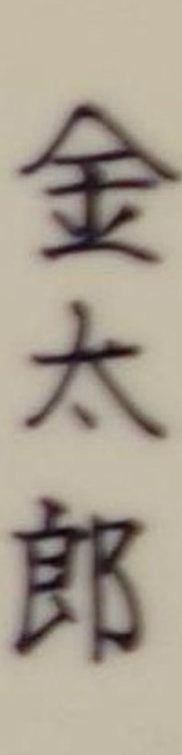金太郎
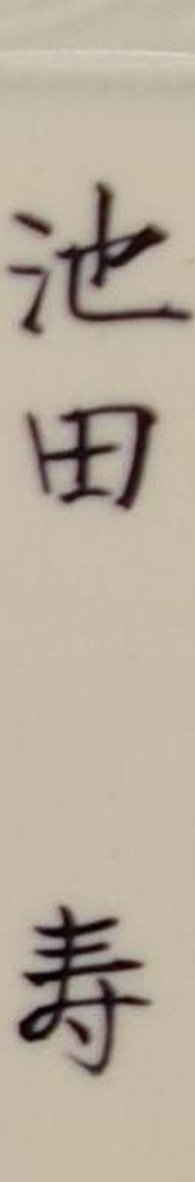池田寿
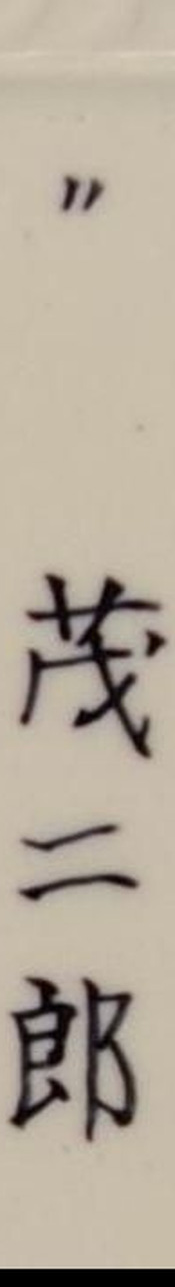茂二郎
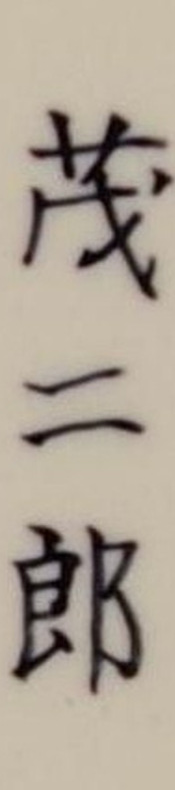茂二郎
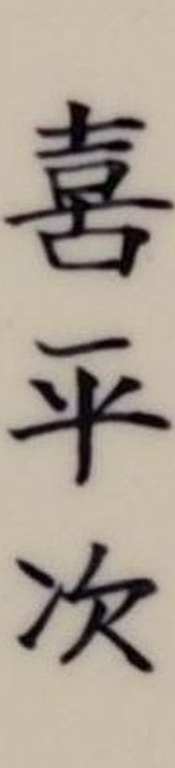喜平次
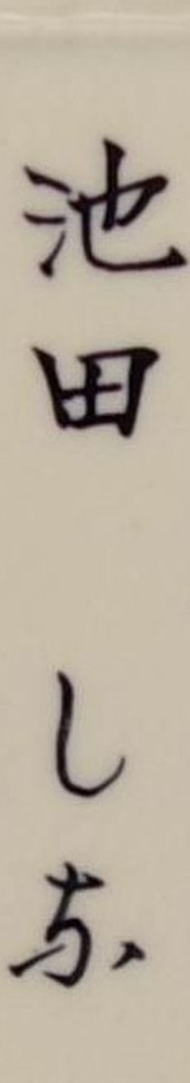池田しな
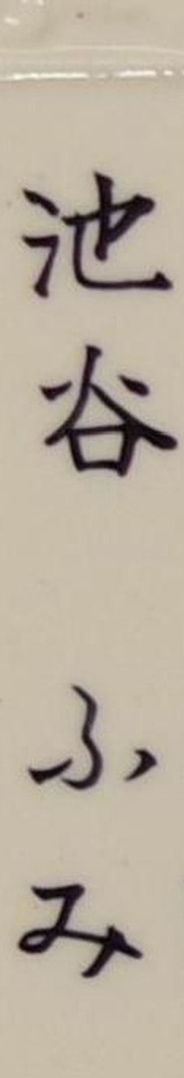池谷ふみ
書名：M~S
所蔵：高野山金剛峯寺
